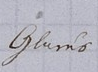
Glarus
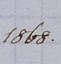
den 2.
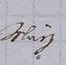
März
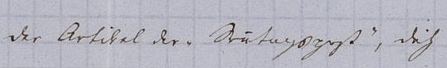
Der Artikel der «Sonntagspost», Dich
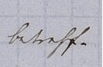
betreff-
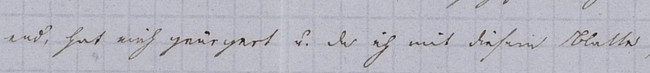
end, hat mich geärgert u. da ich mit diesem Blatte
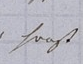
sonst
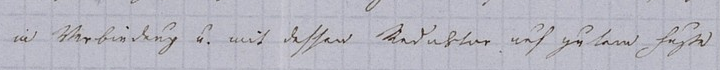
in Verbindung u. mit dessen Redaktor auf gutem Fuße
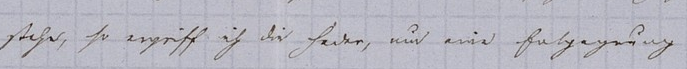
stehe, so ergriff ich die Feder, um eine Entgegnung
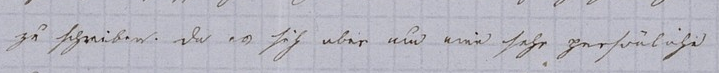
zu schreiben. Da es sich aber um eine sehr persönliche
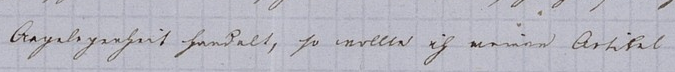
Angelegenheit handelt, so wollte ich meinen Artikel
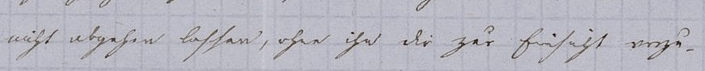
nicht abgehen lassen, ohne ihn Dir zur Einsicht vorzu-
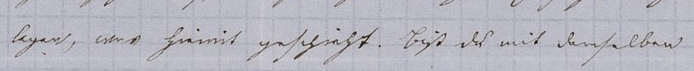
legen, was hiemit geschieht. Bist Du mit demselben
